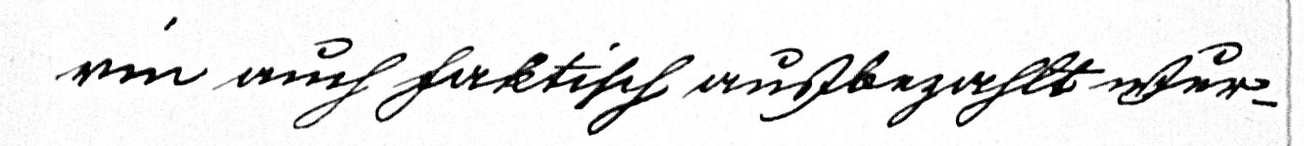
rin auch faktisch ausbezahlt wur¬
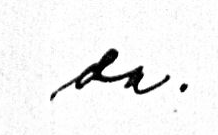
de.
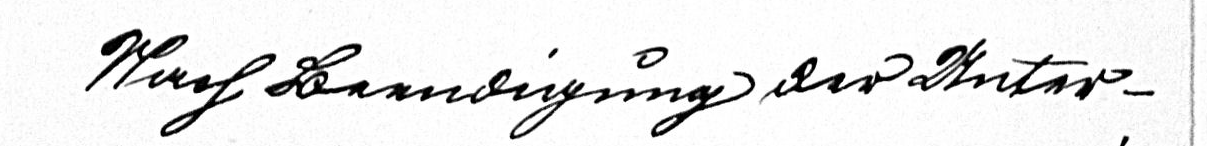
Nach Beendigung der Unter¬
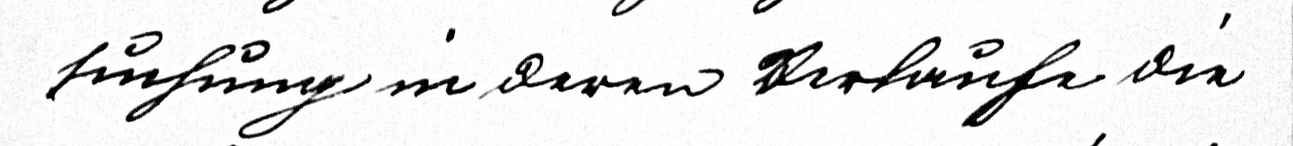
suchung in deren Verlaufe die
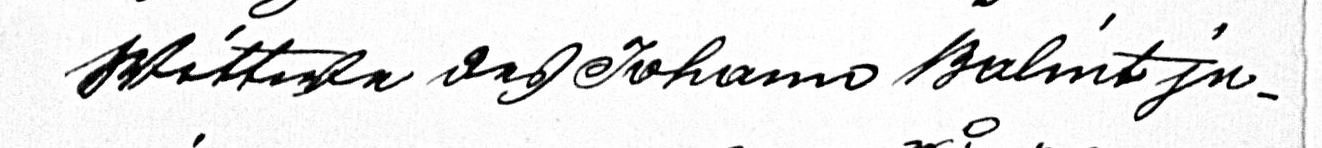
Wittwe des Johann Balint ju¬
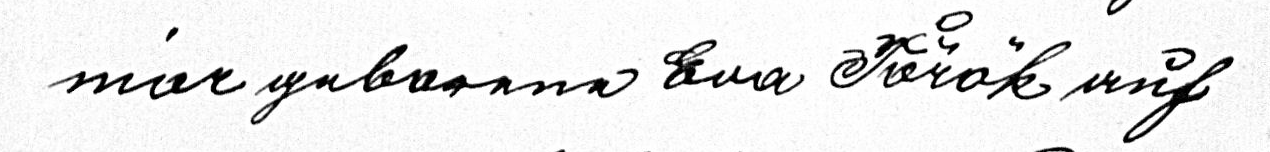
nior geborene Eva Török auf
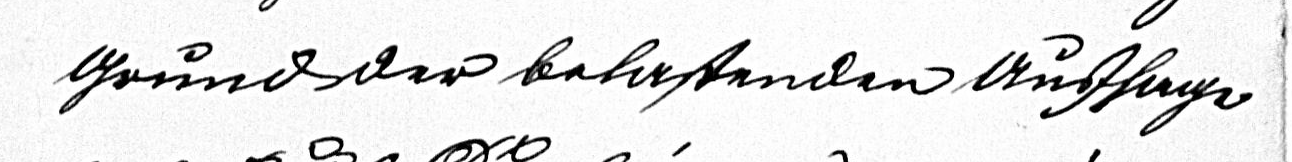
Grund der belastenden Aussage
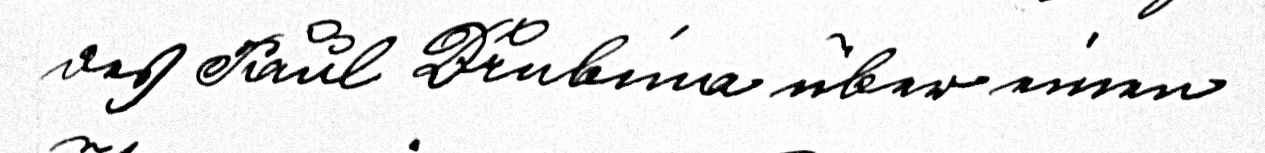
des Paul Drubina über einen
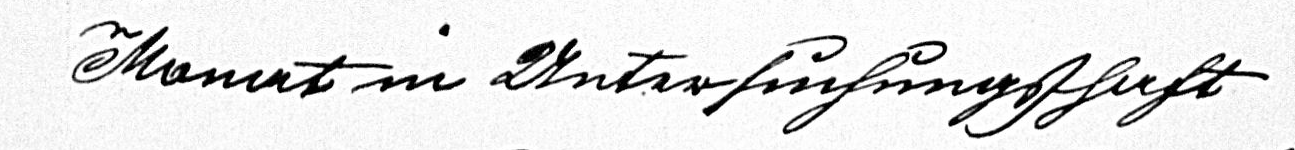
Monat in Untersuchungshaft
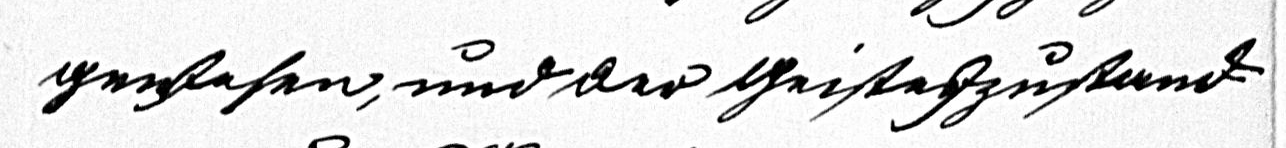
gewesen, und der Geisteszustand
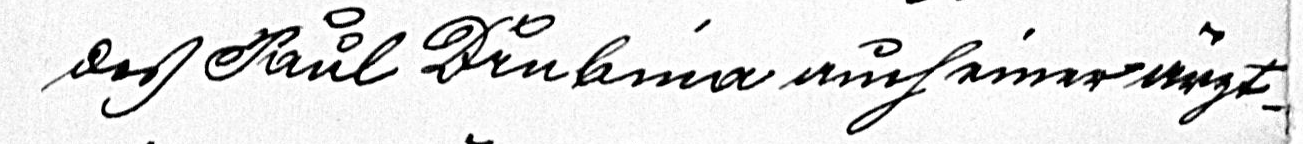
des Paul Drubina auch einer ärzt¬
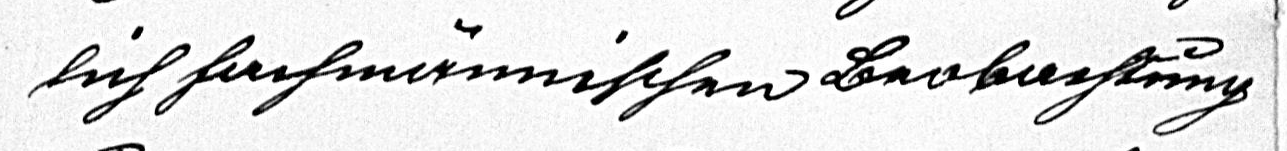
lich fachmännischen Beobachtung
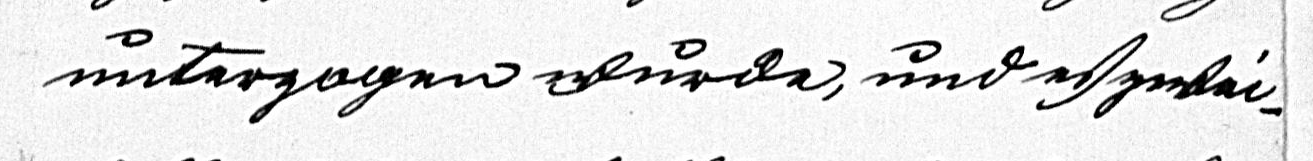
unterzogen wurde, und es zwei¬
